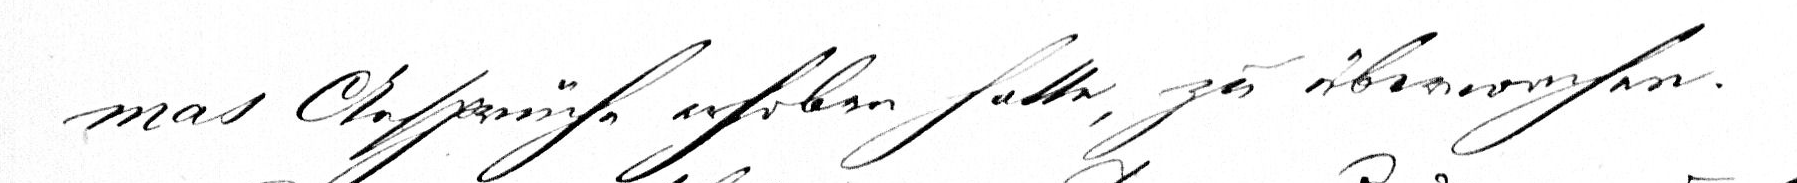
mas Ansprüche erhoben hatte, zu überwachen.
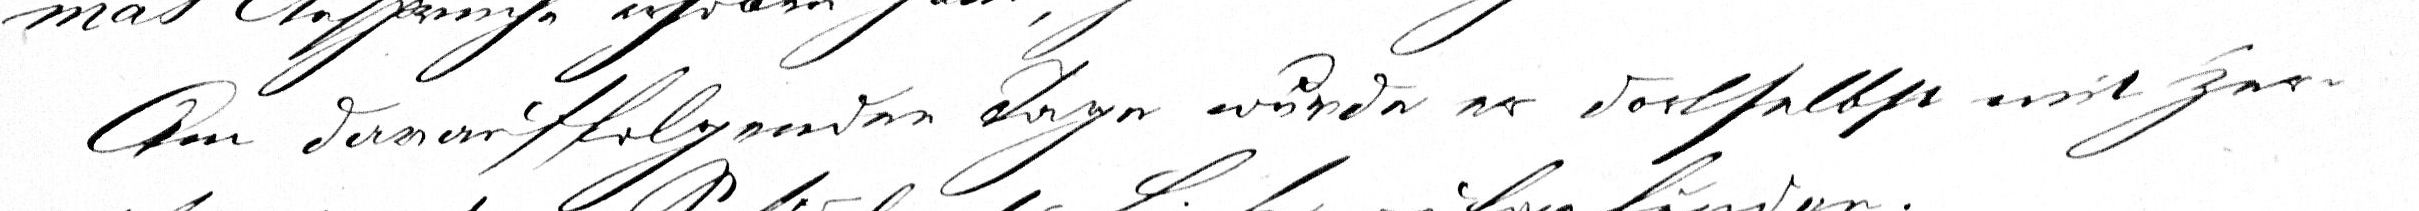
Am darauffolgenden Tage wurde er dortselbst mit Zer¬
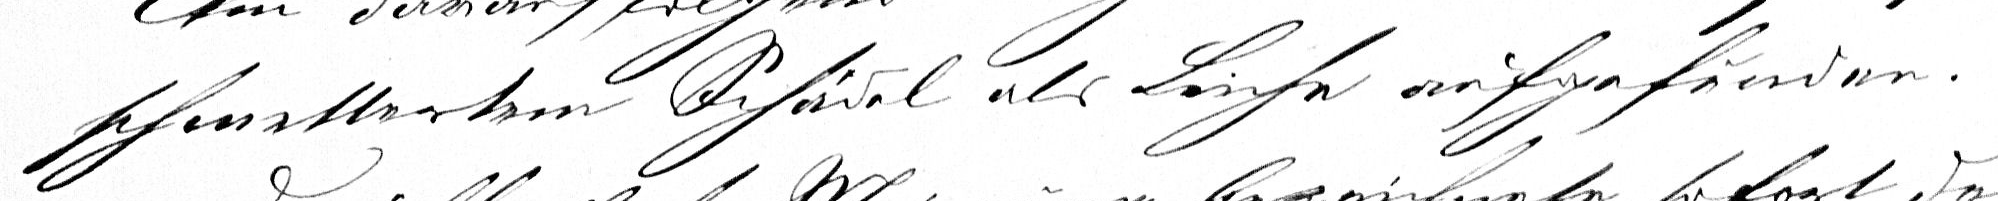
schmettertem Schädel als Leiche aufgefunden.
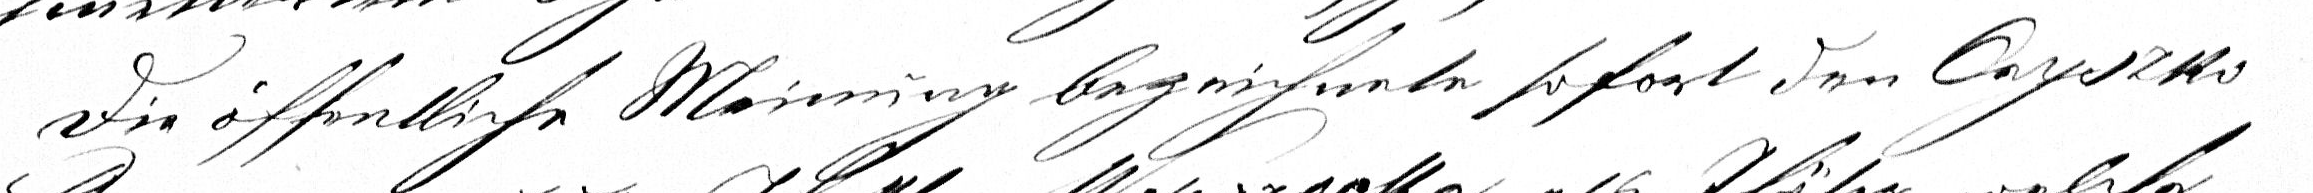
Die öffentliche Meinung bezeichnete sofort den Onyszko
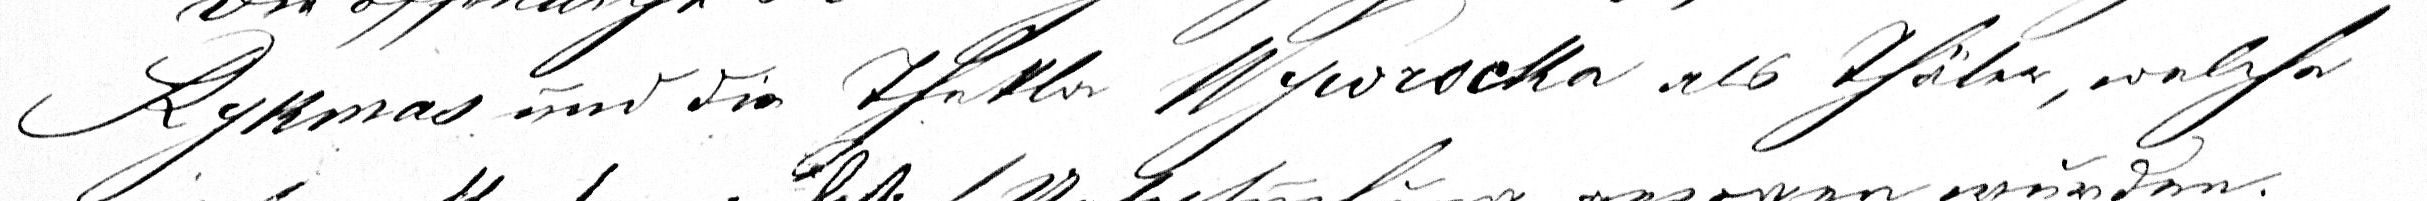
Rykmas und die Thekla Wywrocka als Thäler, welche
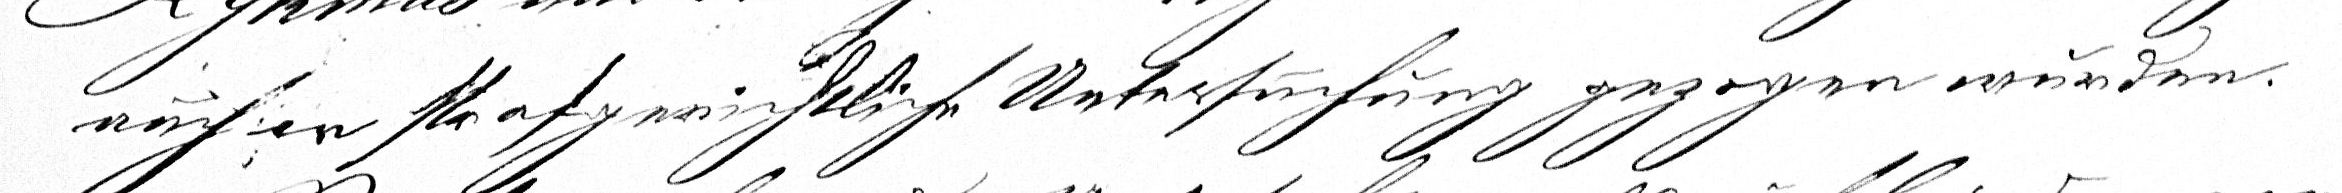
auch in strafgerichtliche Untersuchung gezogen wurden.
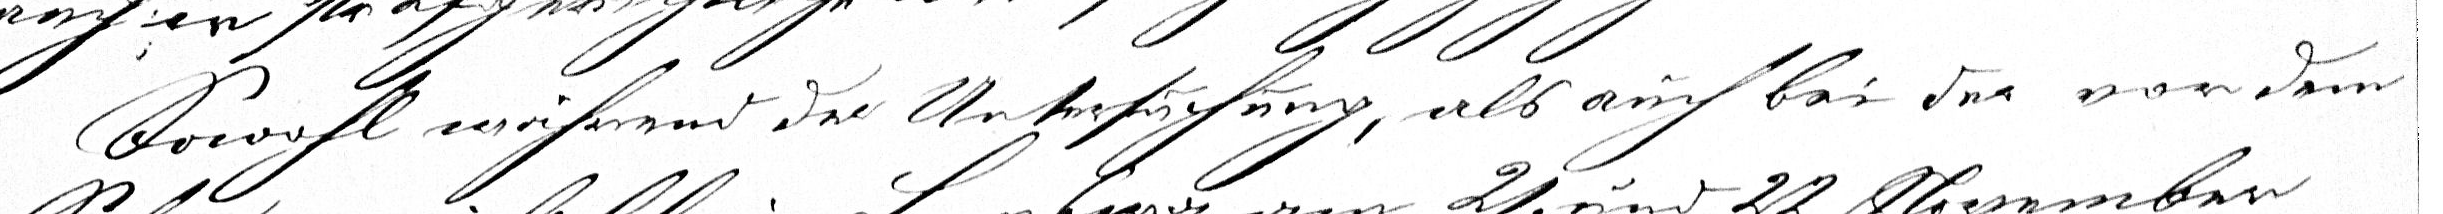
Sowohl während der Untersuchung, als auch bei der vor dem
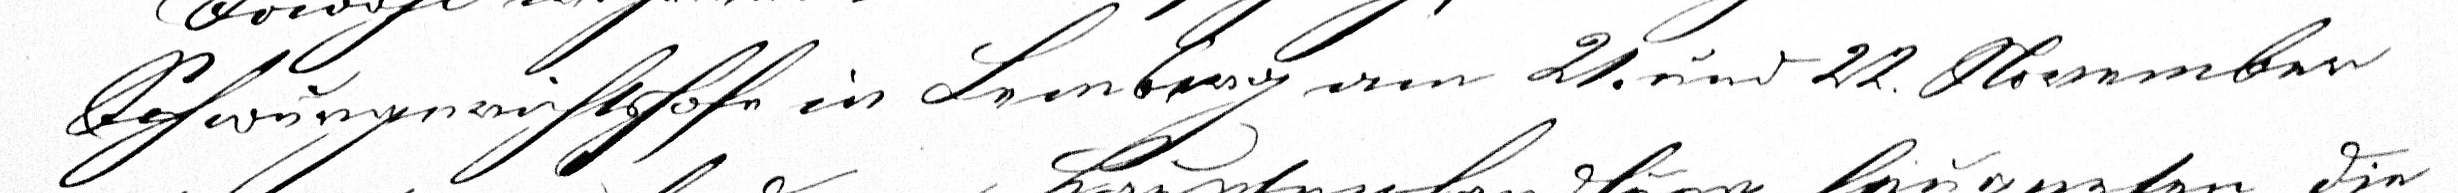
Schwurgerichtshofe in Lemberg am 21. und 22. November
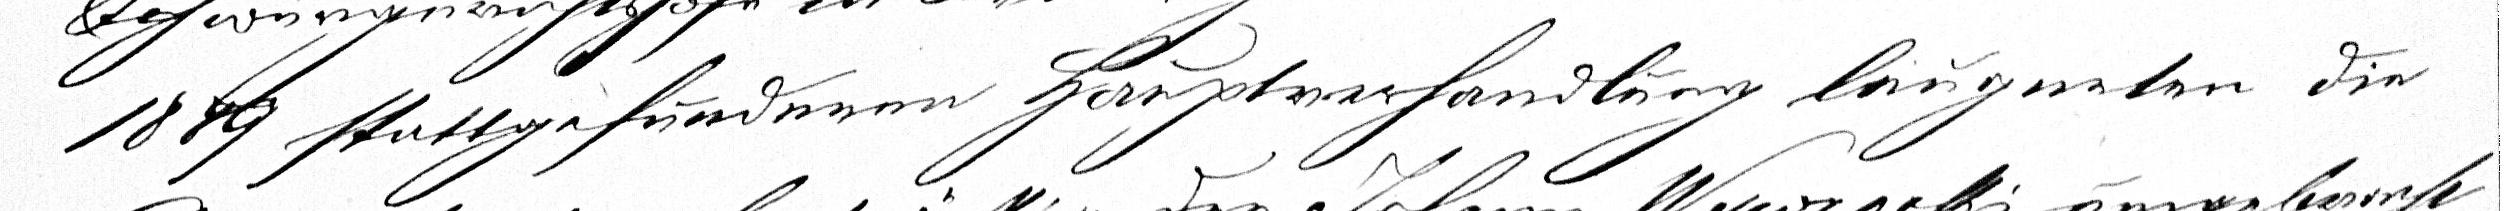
1889 stattgefundenen Hauptverhandlung leugneten die
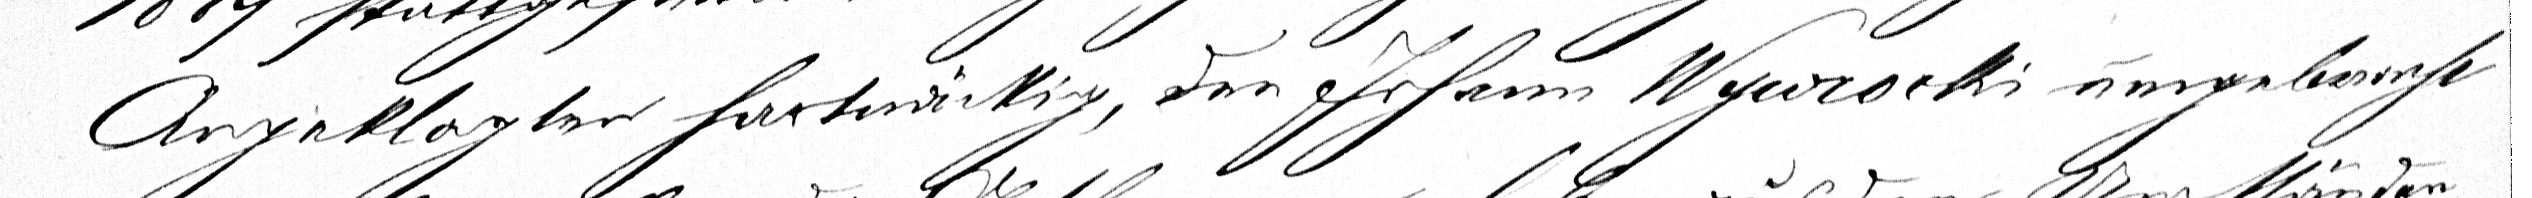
Angeklagten hartnäckig, den Johann Wywrocki umgebracht
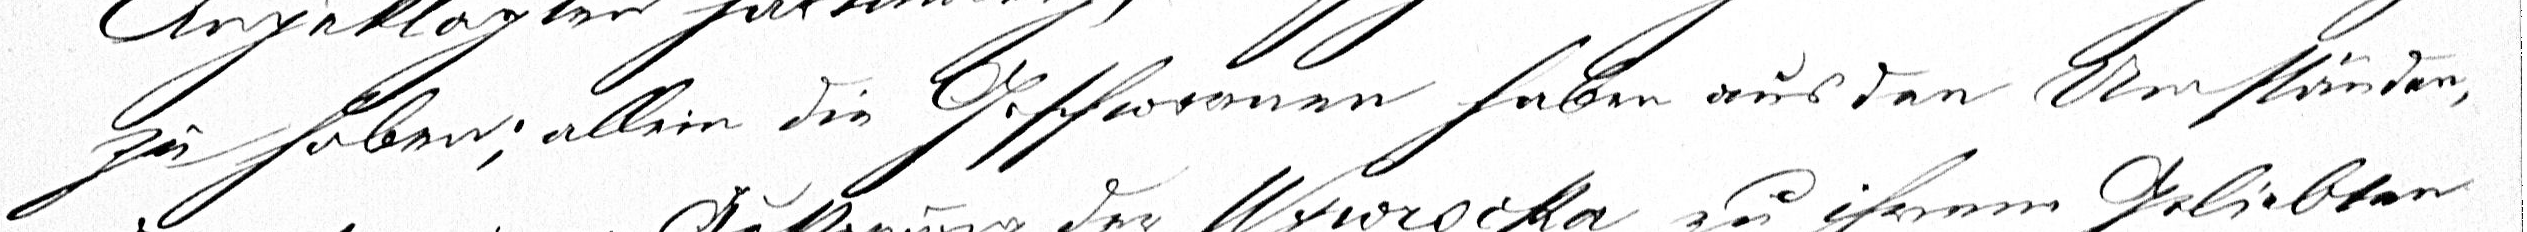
zu haben; allein die Geschwornen haben aus den Umständen,
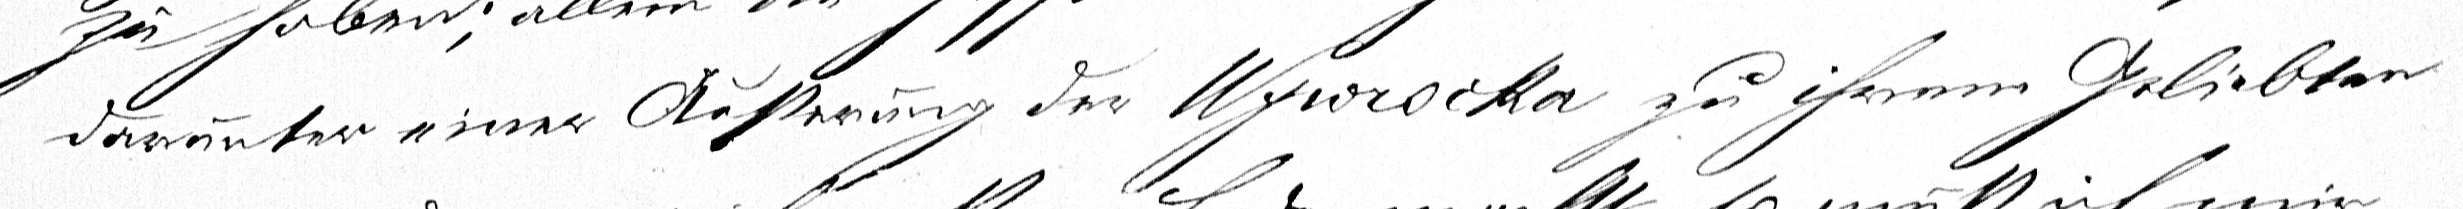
darunter einer Äußerung der Wywrocka zu ihrem Geliebten
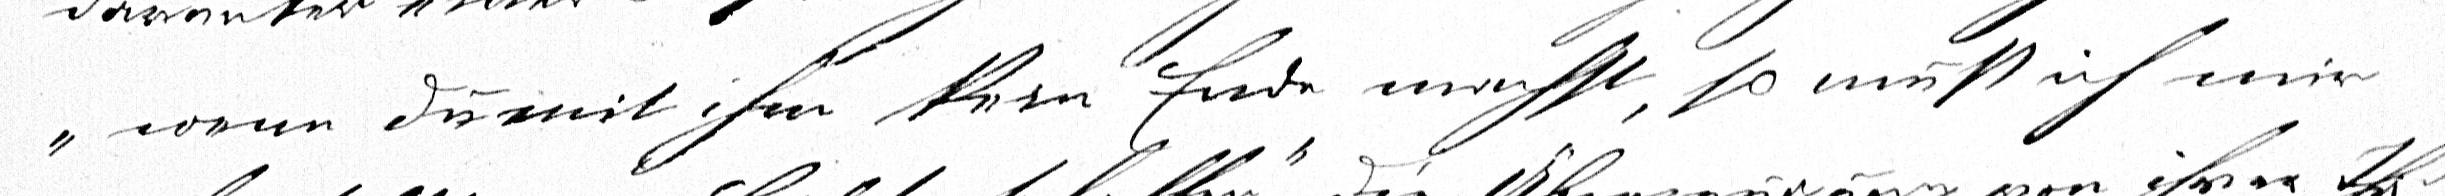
„wenn dumit ihm keiun Ende machst, so muß ich mir
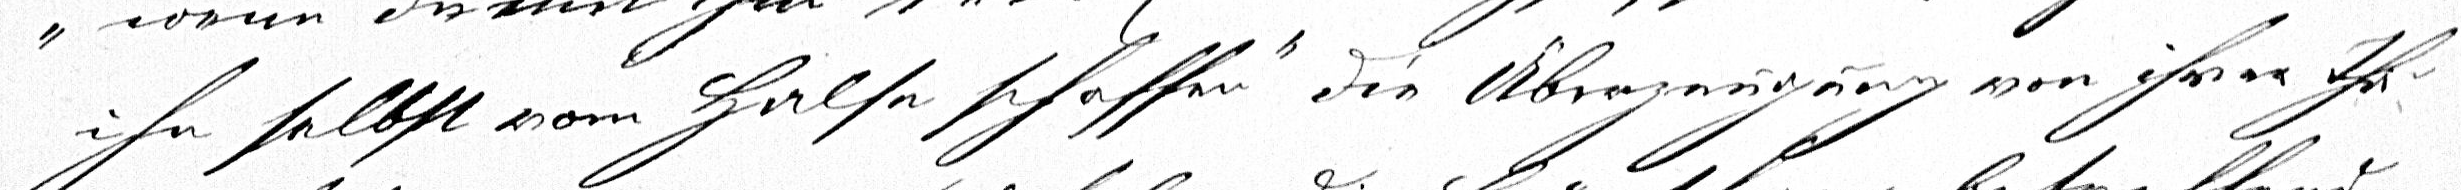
ihn selbst vom Halse schaffen“ die Überzeugung von ihrer Thä¬
